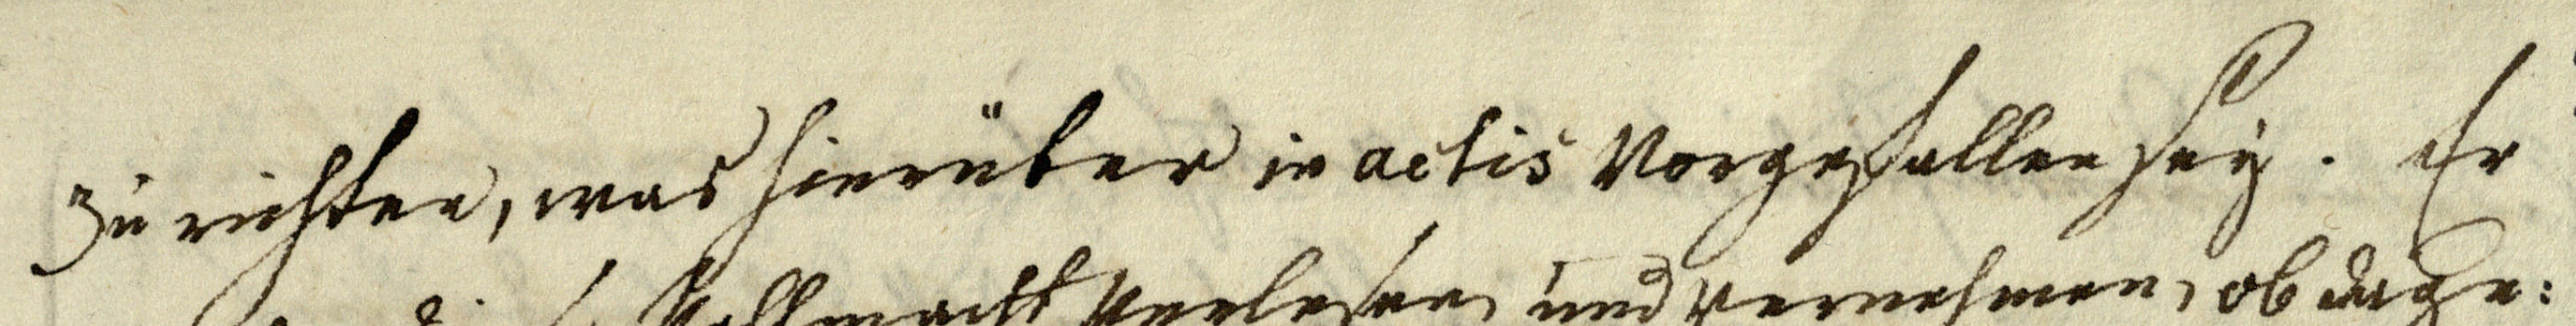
zu richten, was hierüber in actis vorgefallen seÿ. Er
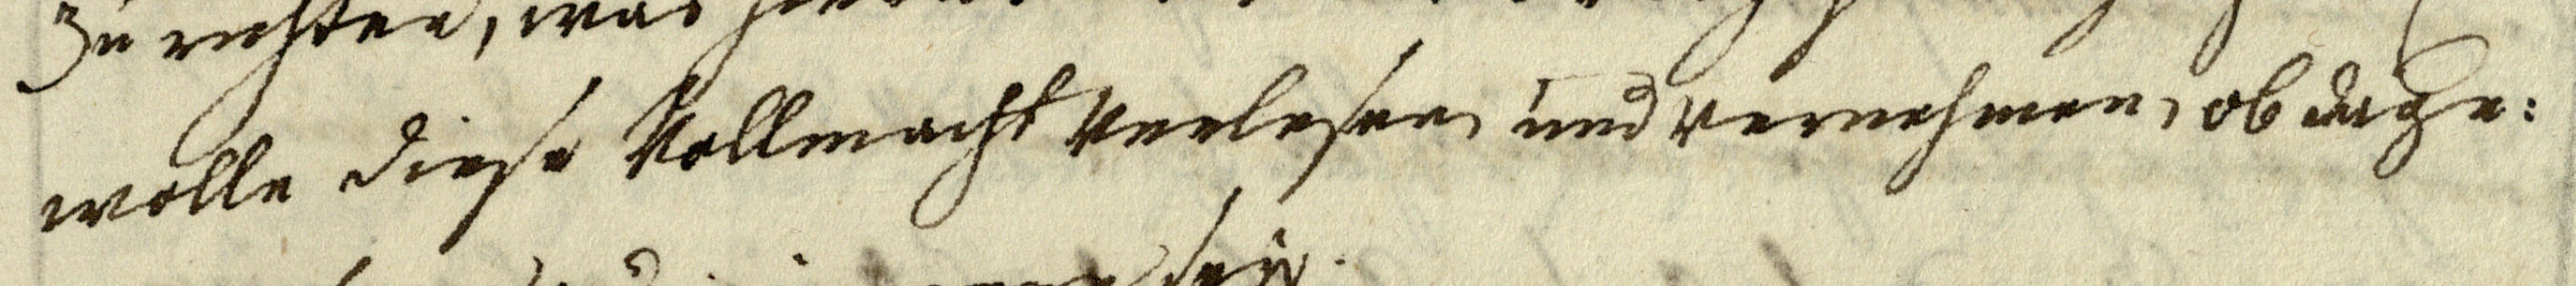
wolle diese Vollmacht verlesen, und vernehmen, ob dage¬
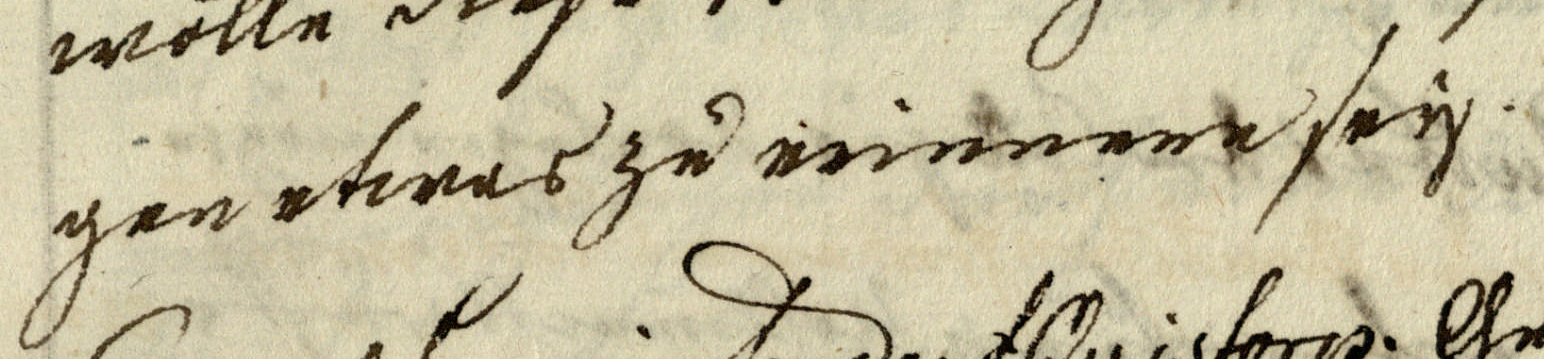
gen etwas zu erinnern seÿ.
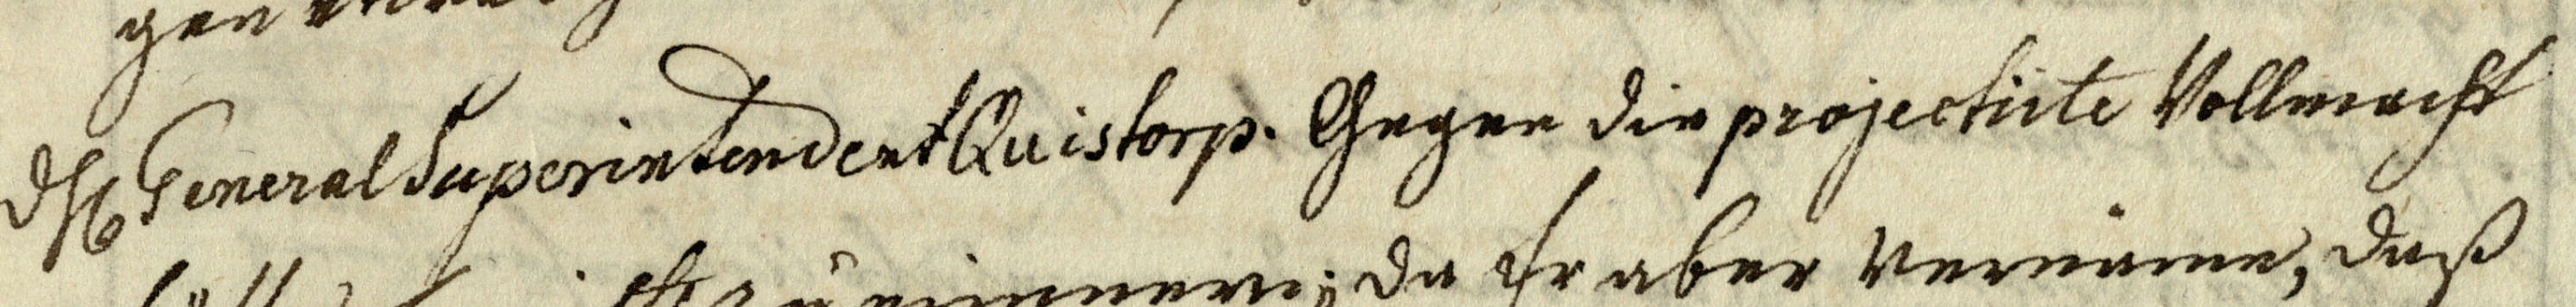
dh Generalsuperintendent Quistorp. Gegen die projectirte Vollmacht
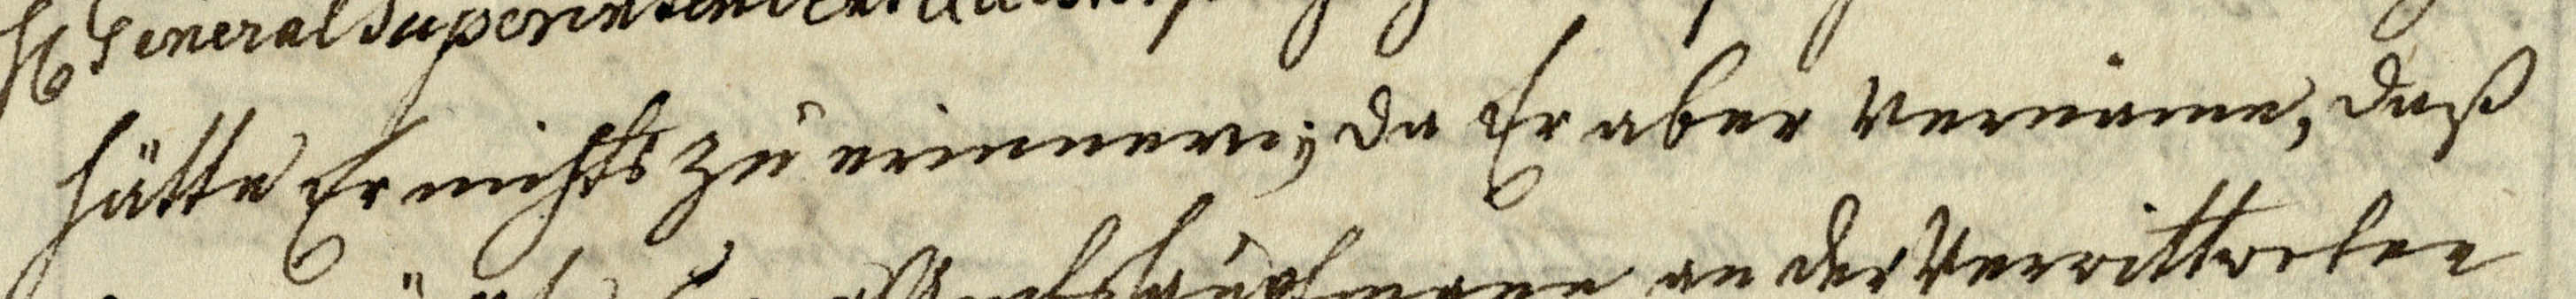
hätte Er nichts zu erinnern; da Er aber vernäme, daß
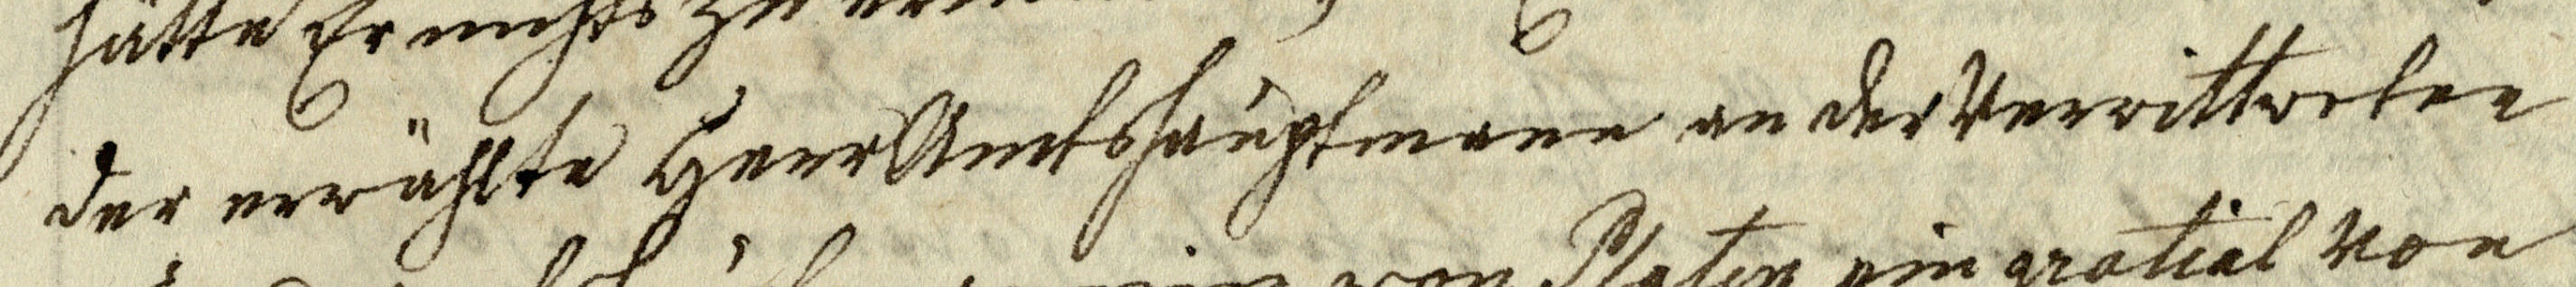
der erwählte Herr Amtshauptmann an der verwittweten
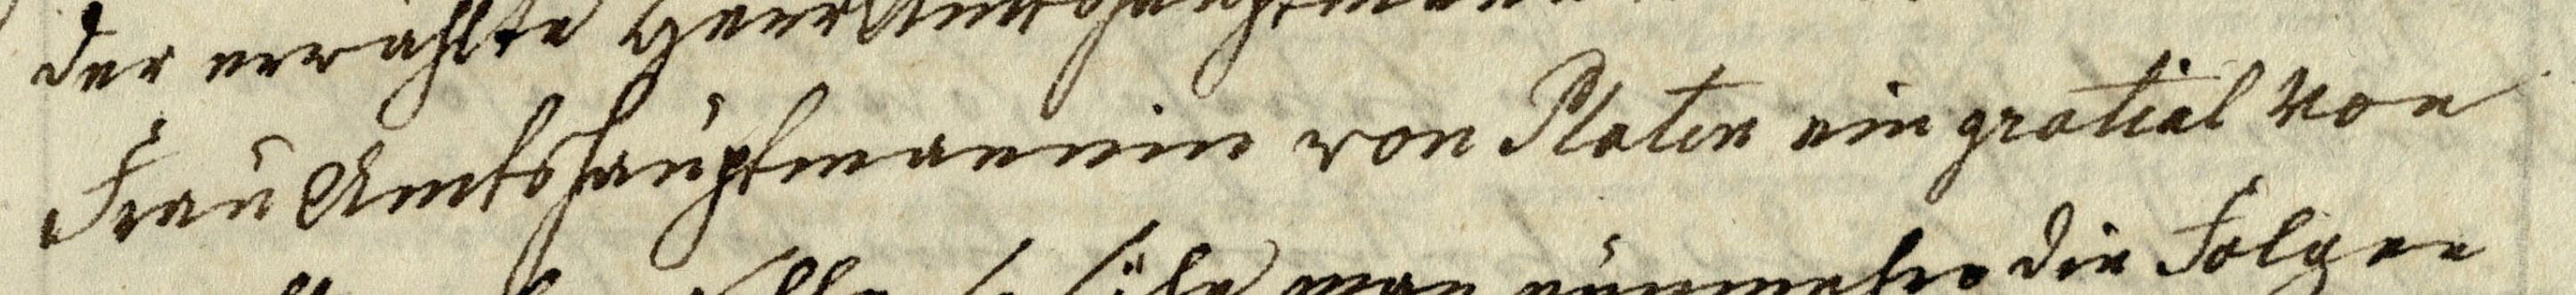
Frau Anmtshauptmannin von Platen ein gratial von
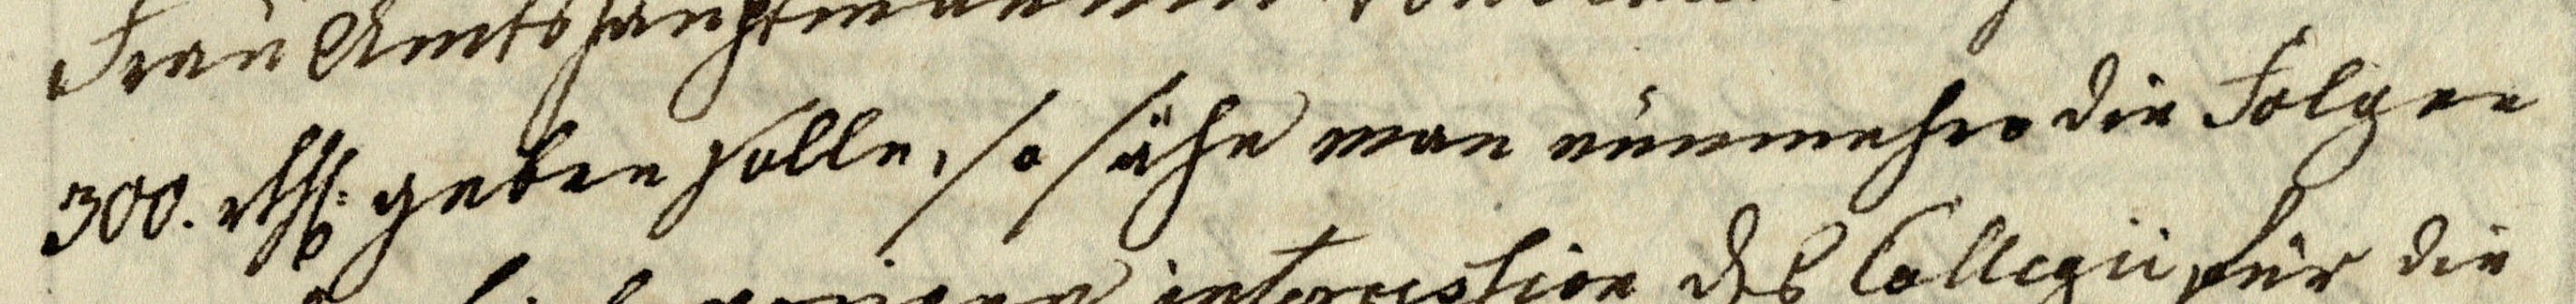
300. rthl. geben solle, so sähe man nunmehro die Folgen
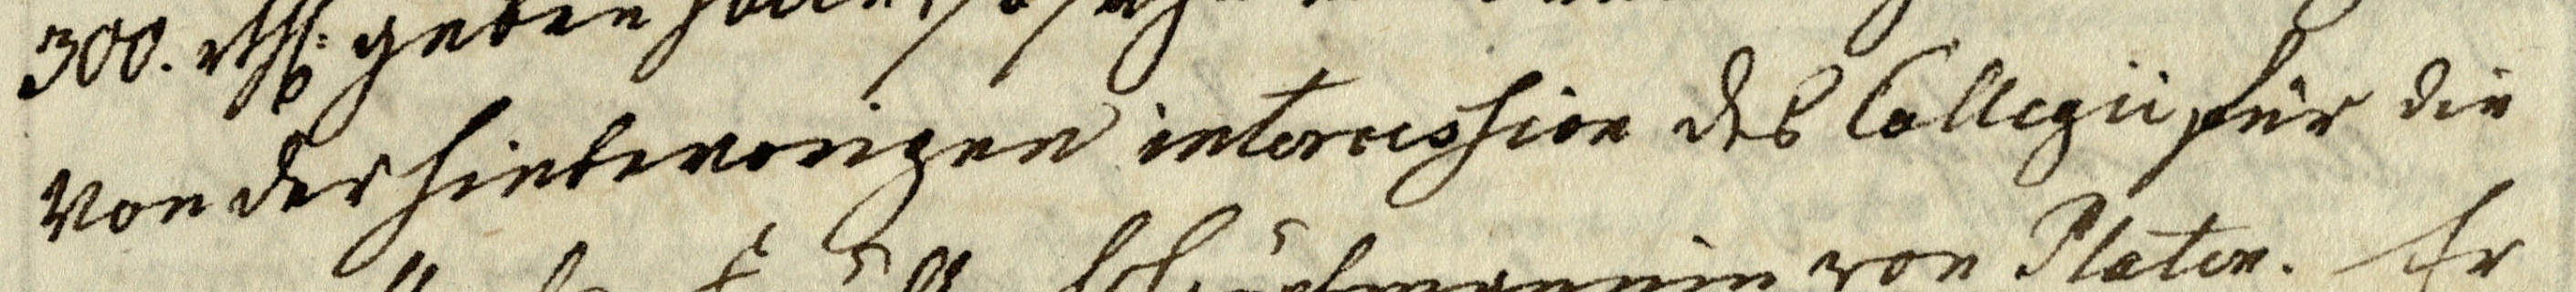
von der hiebevorigen intercession des Collegii für die
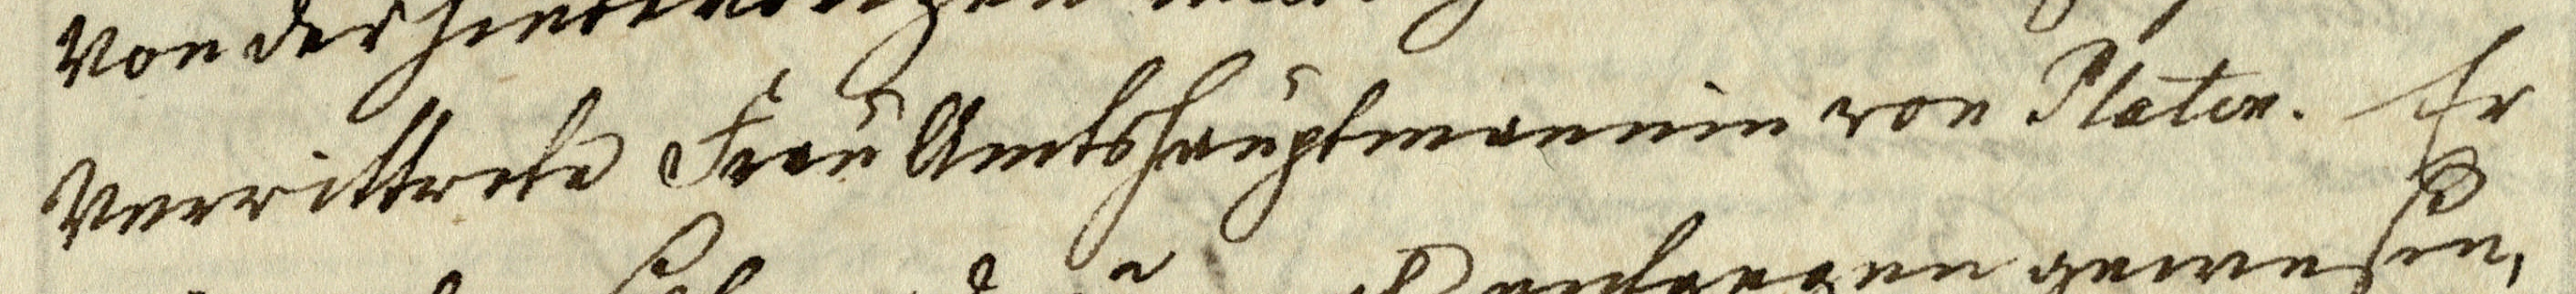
verwittwete Frau Amtshauptmannin von Platen. Er
